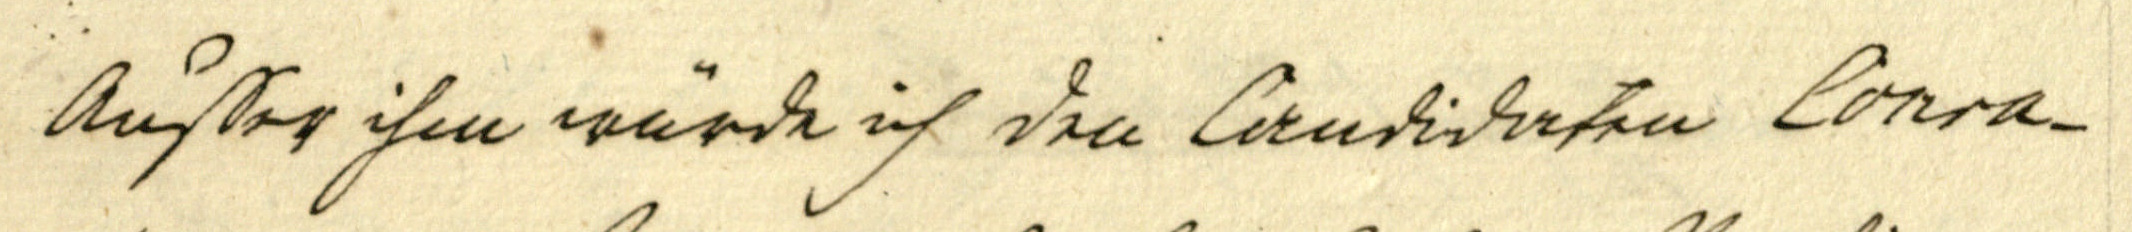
Ausser ihm würde ich den Candidaten Conra¬
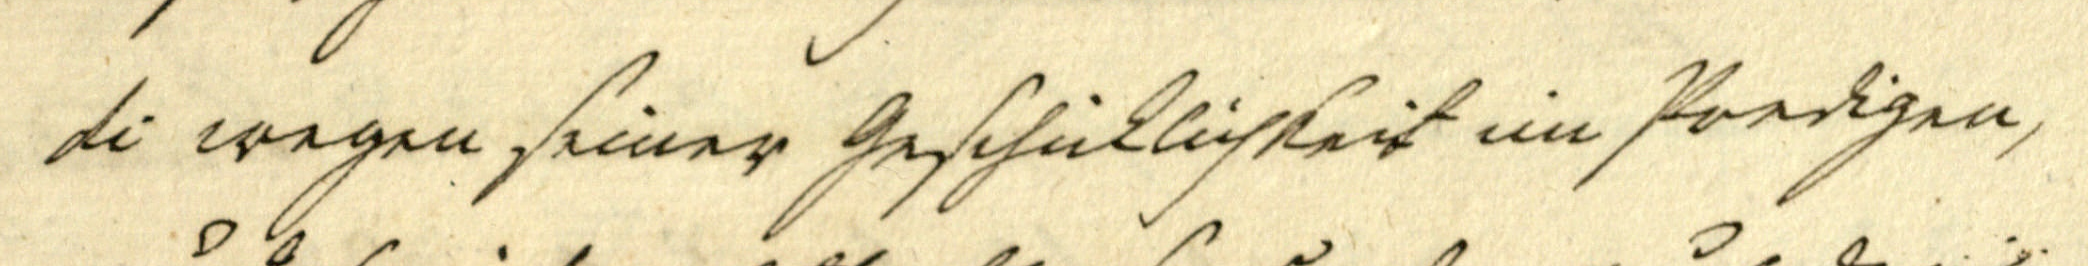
di wegen seiner Geschicklichkeit im Predigen,
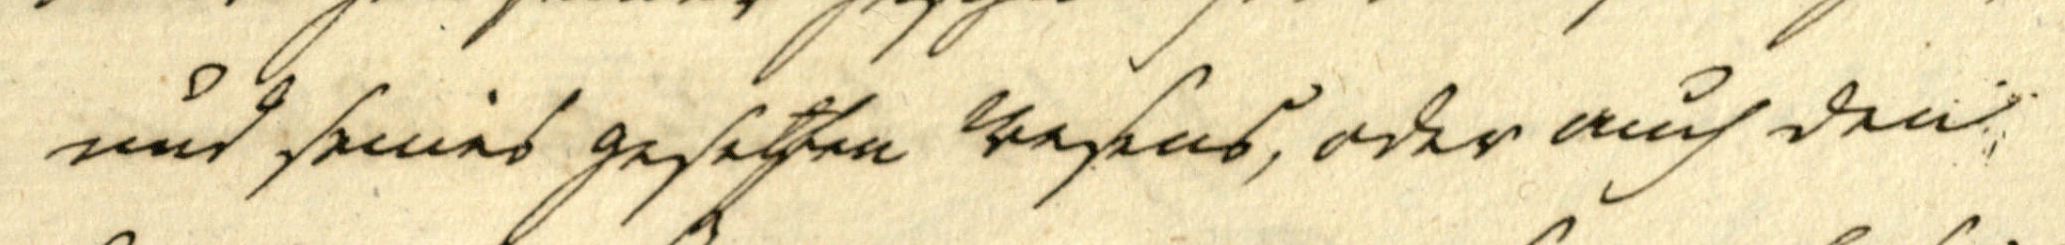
und seines gesetzten Wesens, oder auch den
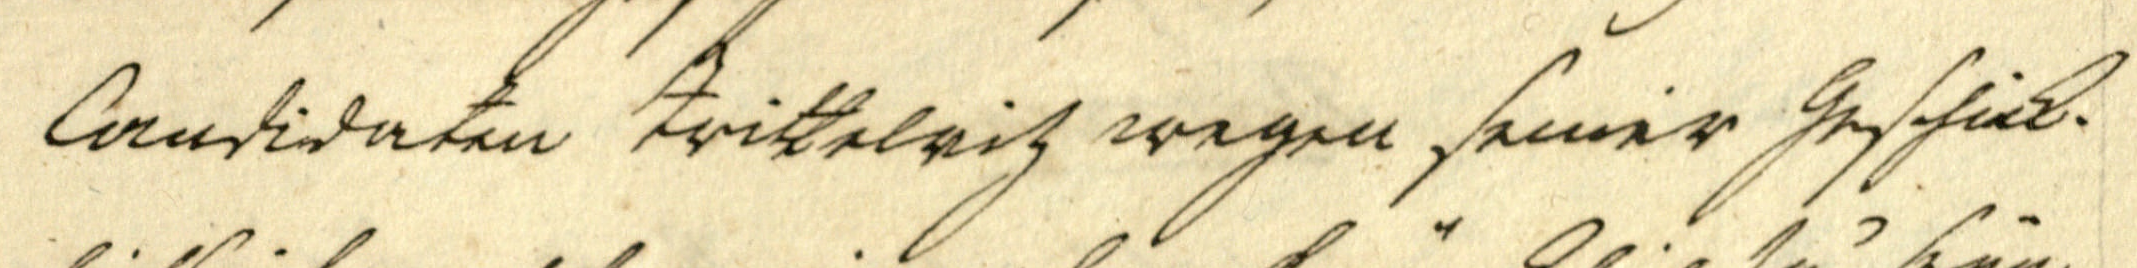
Candidaten Trittelvitz wegen seiner Geschick¬
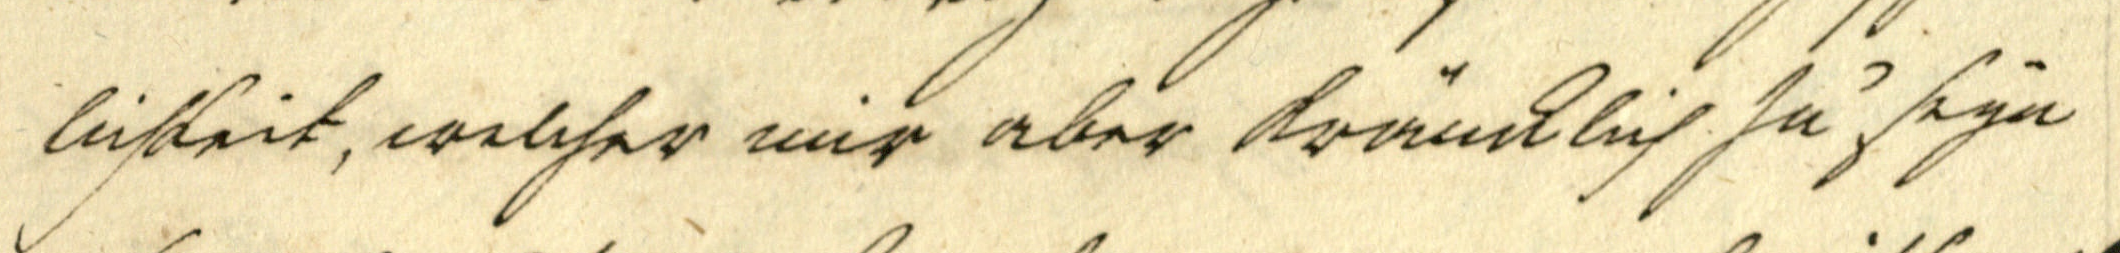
lichkeit, welcher mir aber kräncklich zu seÿn
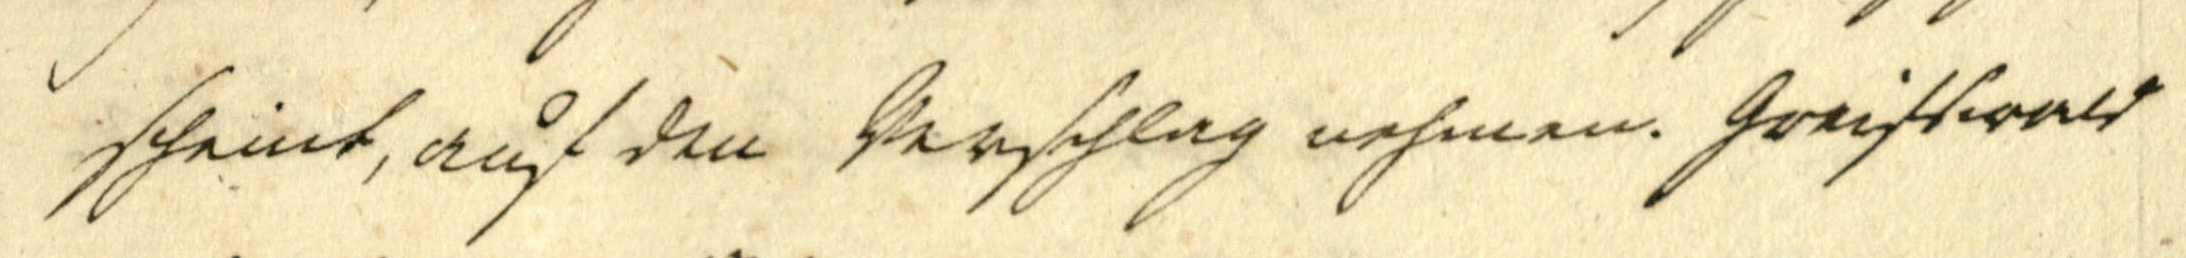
scheint, auf den Verschlag nehmen Greifswald
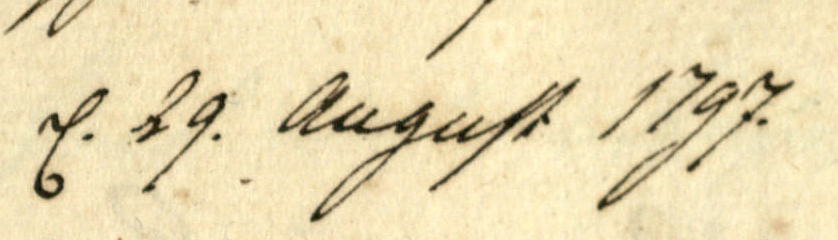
d 29. August 1797.
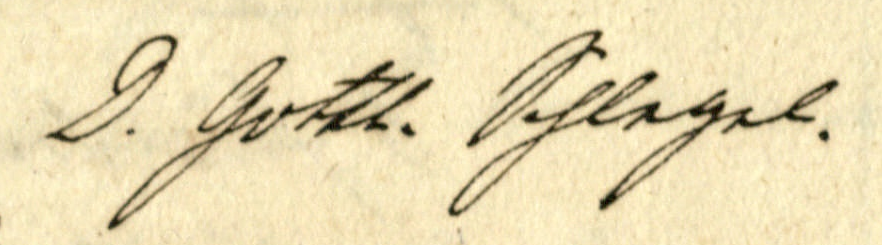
D. Gottl. Schlegel.
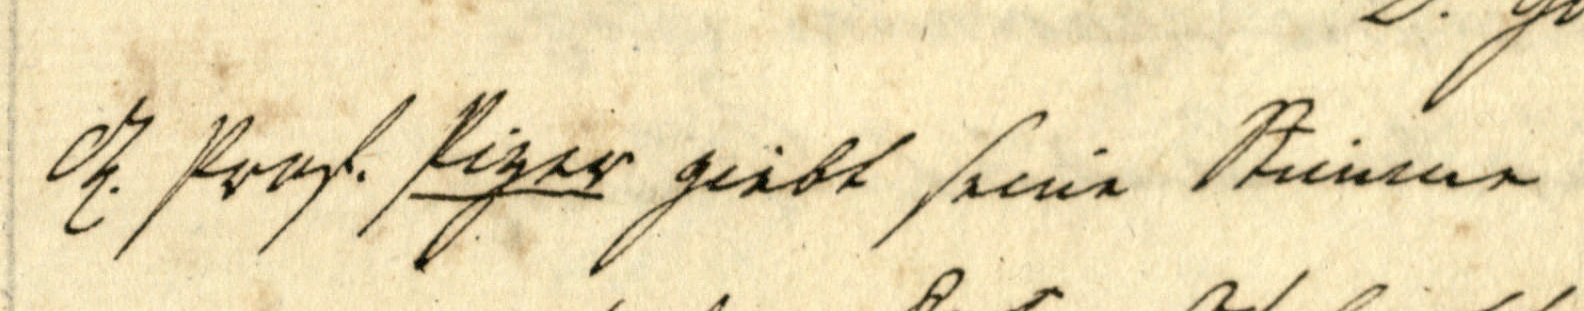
dh. Prof. Piper giebt seine Stimme
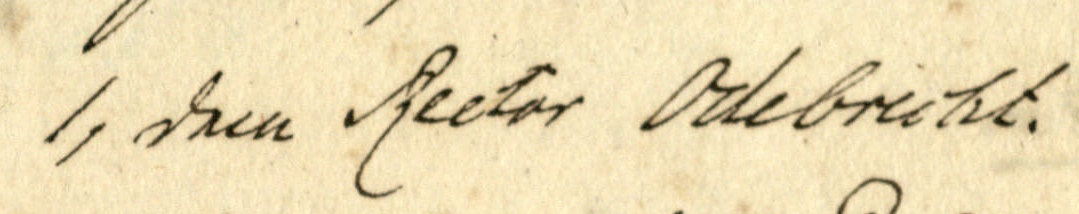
1, dem Rector Odebrecht.
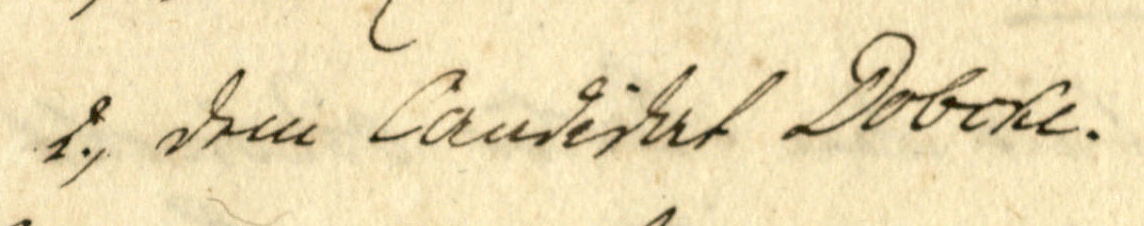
2., dem Candidat Dobcke.
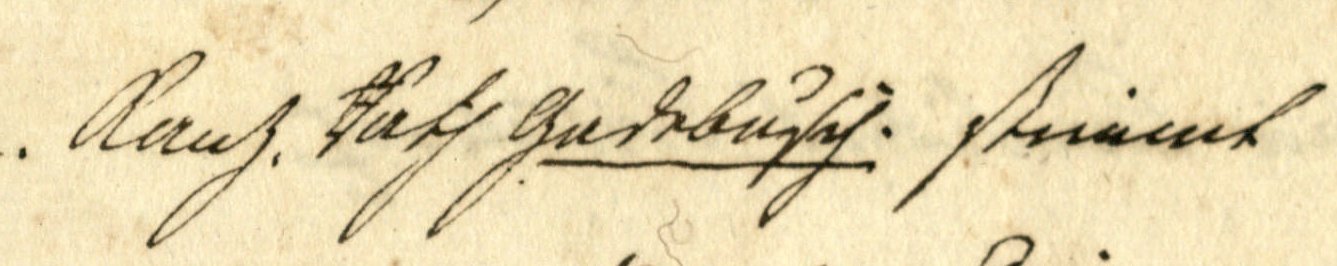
Kanz. Rath Gadebusch. stimmt
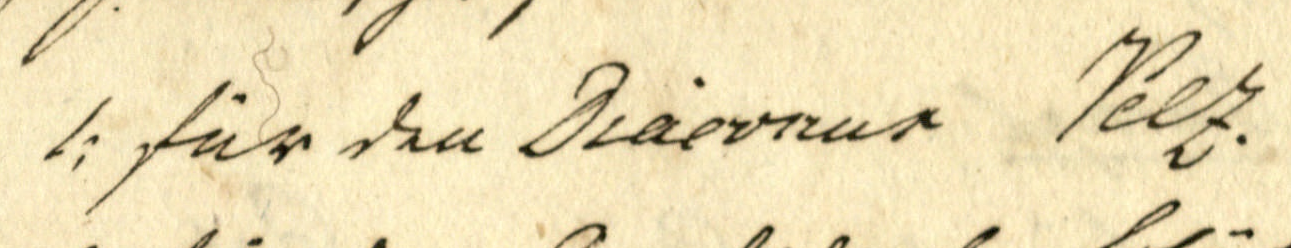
1; für den Diaconus Pelz.
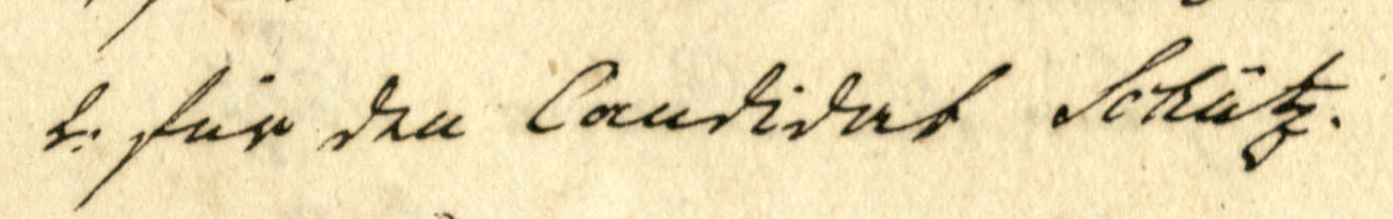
2. für den Candidat Schütz.
